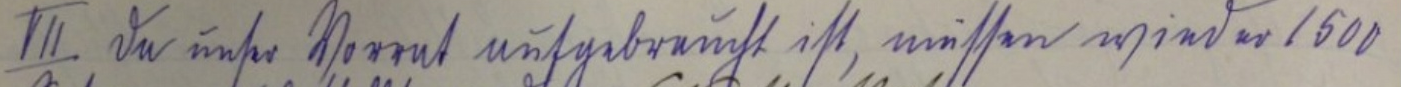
VII Da unser Vorrat aufgebraucht ist, müssen wieder
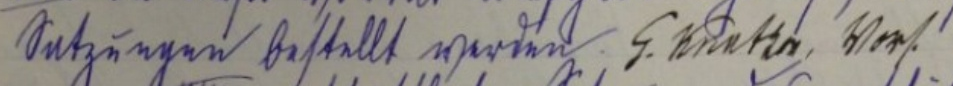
1500 Satzungen bestellt werden. G. Knutzen Vors.
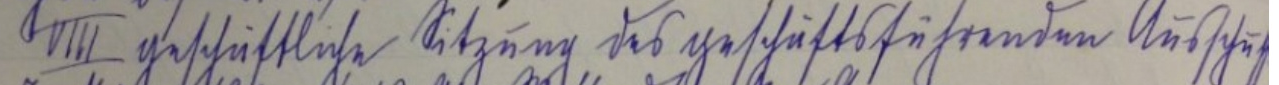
VIII geschäftliche Sitzung des geschäftführenden Ausschuss
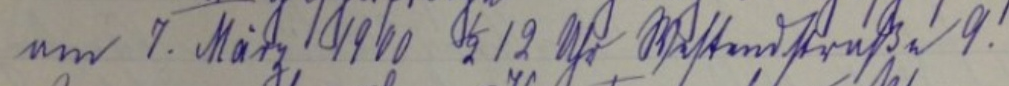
am 7. März 1900 ½12 Uhr Westendstraße 9
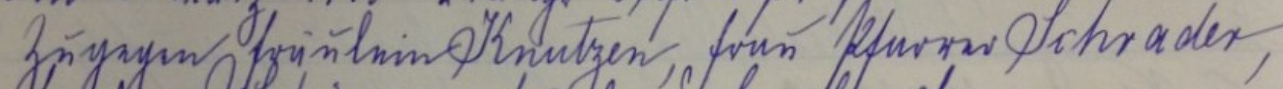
Zugegen Fräulein Knutzen, Frau Pfarrer Schrader,
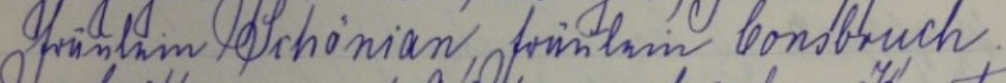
Fräulein Schönian, Fräulein Consbruck.
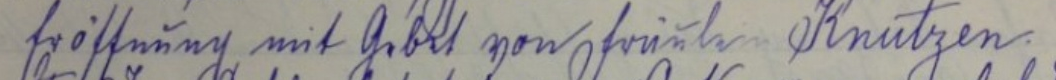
Eröffnung mit Gebet von Fräulein Knutzen.
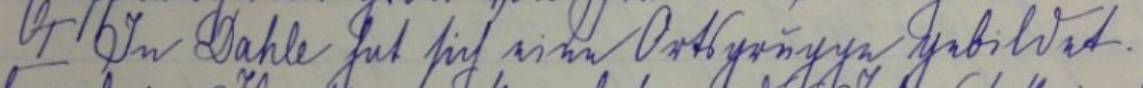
I In Dahle hat sich eine Ortsgruppe gebildet
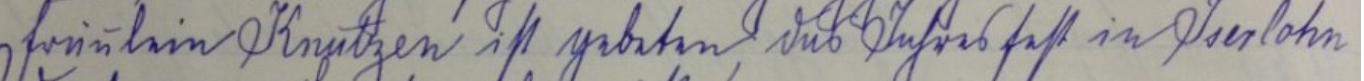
Fräulein Knutzen ist gebeten das Jahresfest in Iserlohn
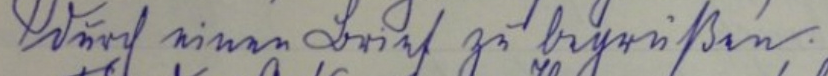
durch einen Brief zu begrüßen.
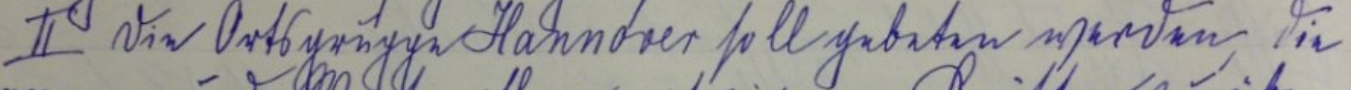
II Die Ortsgruppe Hannover soll gebeten werden die
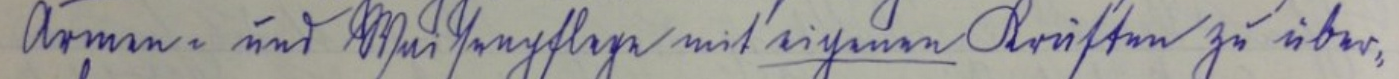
Armen und Weisnpflege mit eigenen Kräften zu über
